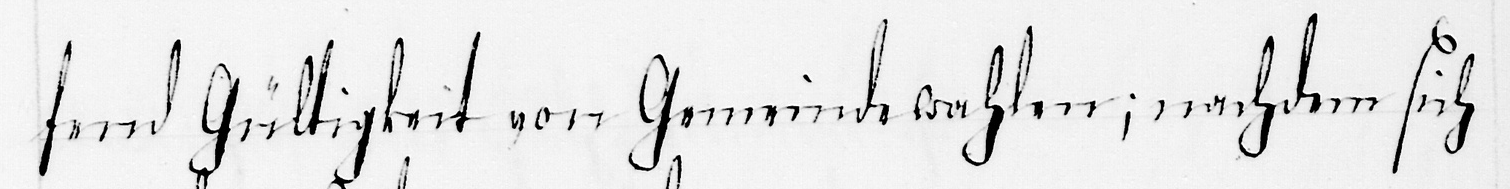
fend Gültigkeit von Gemeindewahlen; nachdem sich
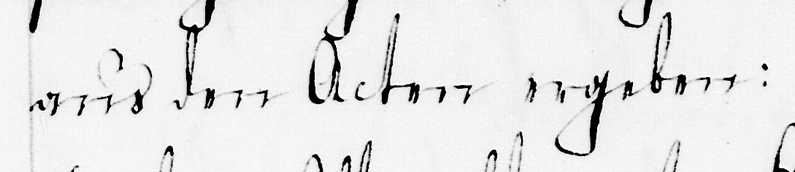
aus den Acten ergeben:
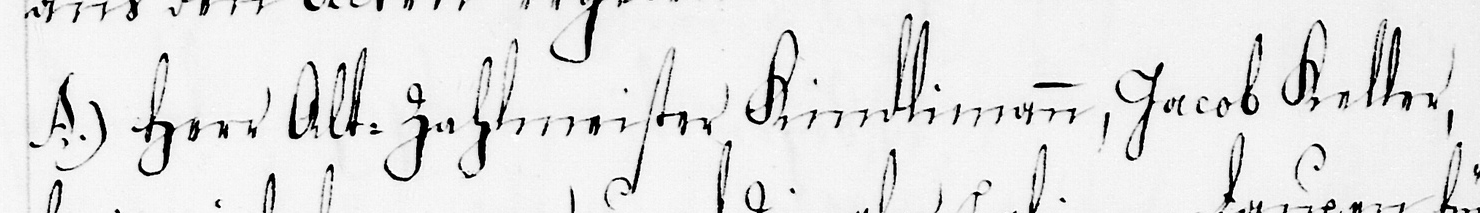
A.) Herr Alt-Zahlmeister Kindlimann, Jacob Keller,
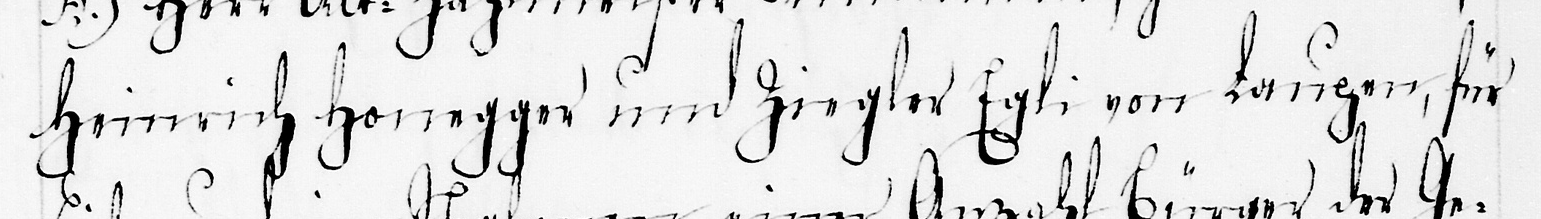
Heinrich Honegger und Ziegler Egli von Laupen, für
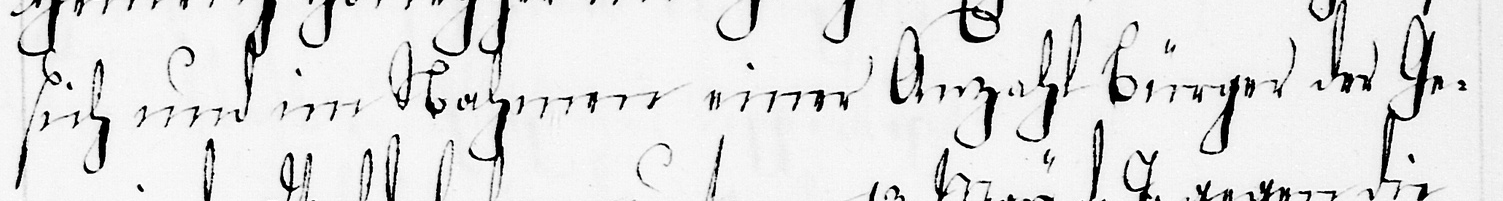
sich und im Nahmen einer Anzahl Bürger der Ge¬
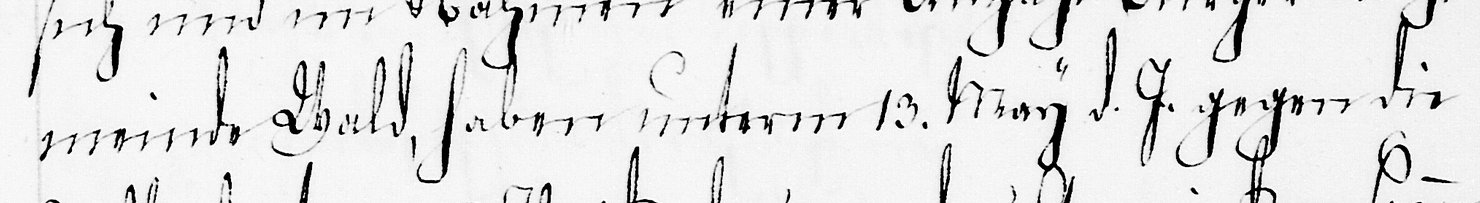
meinde Wald, haben unterm 13. May d. J. gegen die
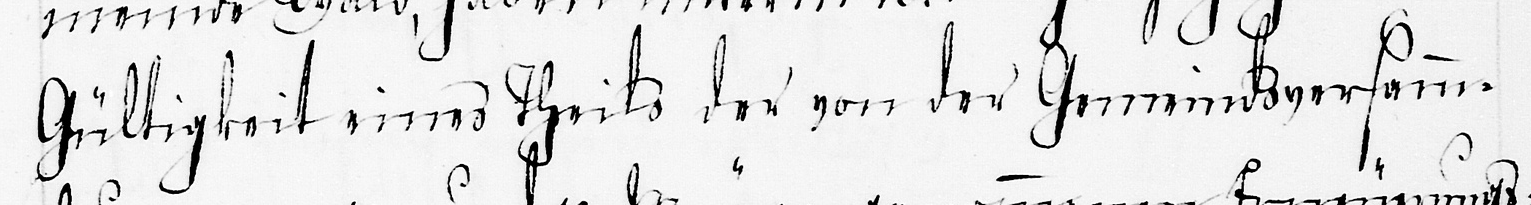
Gültigkeit eines Theils der von der Gemeindsversamm¬
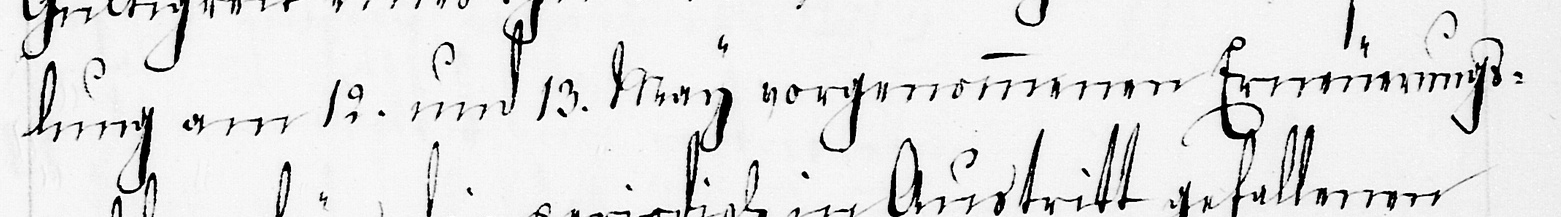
lung am 12. und 13. May vorgenommenen Erneuerungs¬
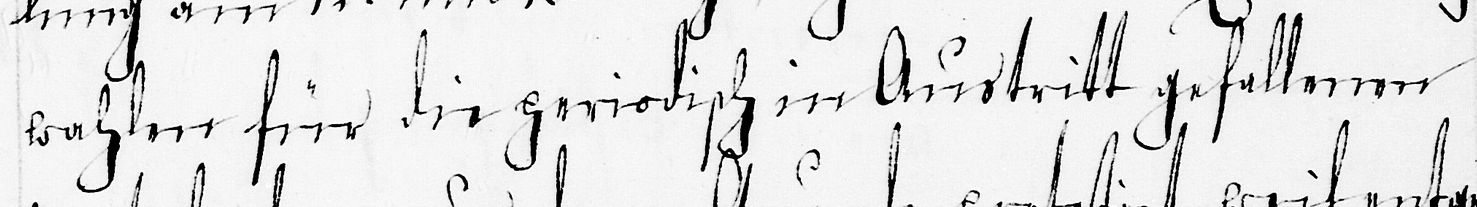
wahlen für die periodisch in Austritt gefallenen
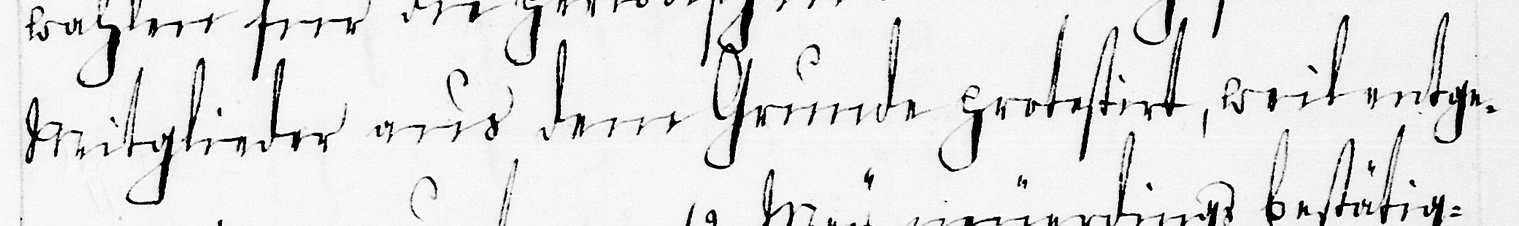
Mitglieder aus dem Grunde protestirt, weil entge¬
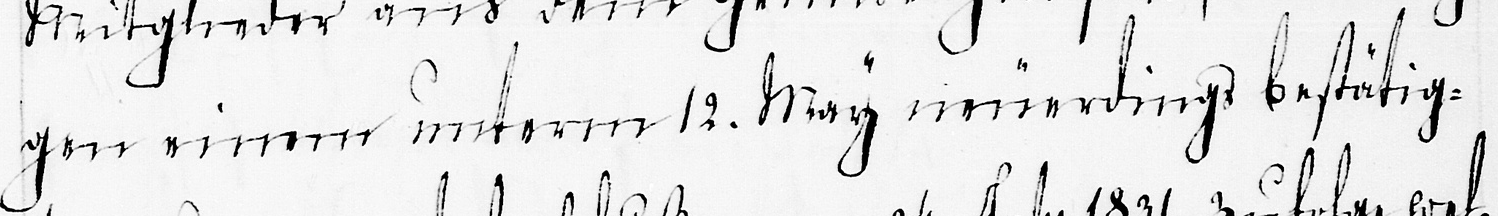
gen einem unterm 12. May neuerdings bestätig¬
